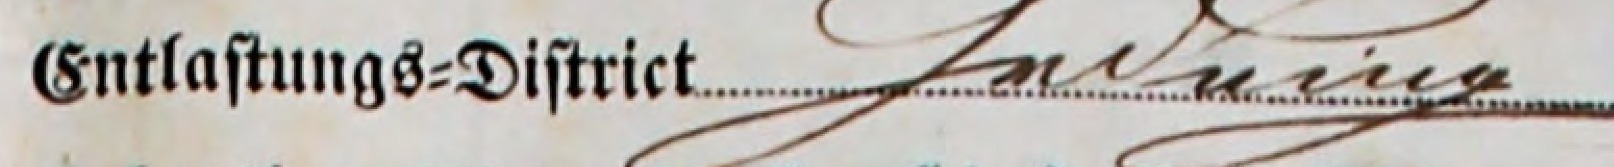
Entlastungs=District Jrdning
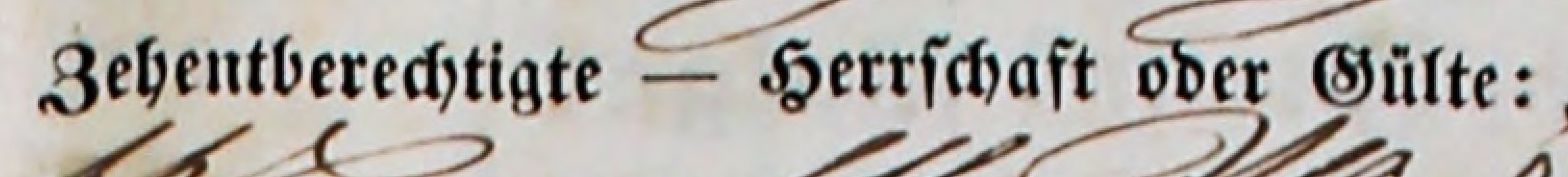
Zehentberechtigte — Herrschaft oder Gülte:
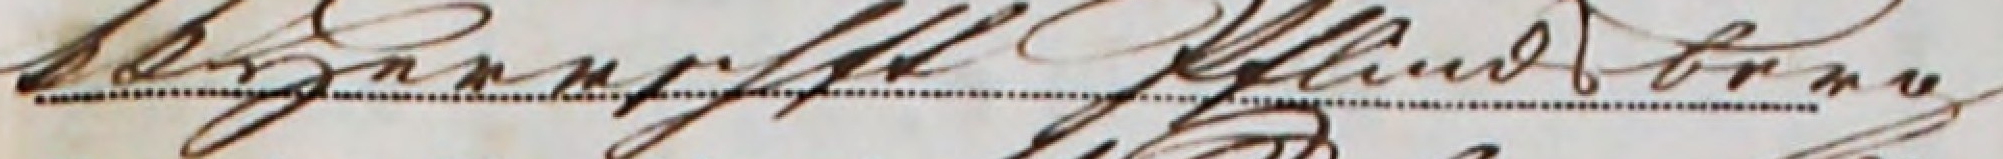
kk Herrschft Pflindsberg
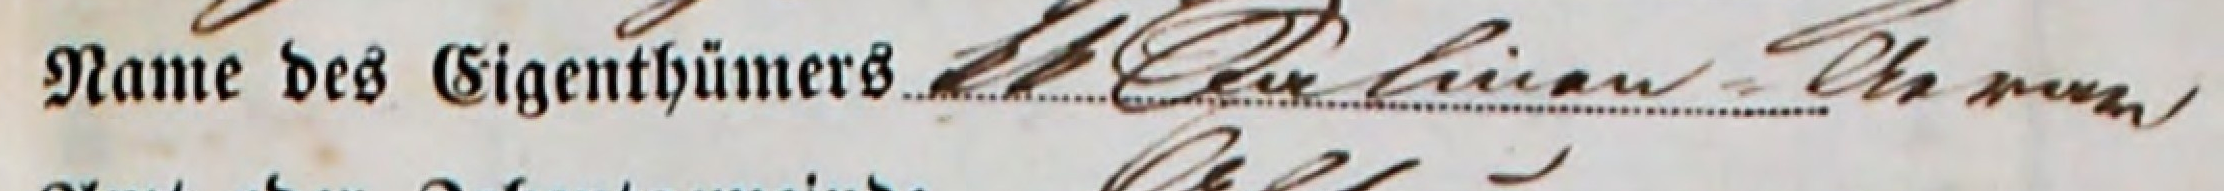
Name des Eigenthümers kk Sabinen = Annan
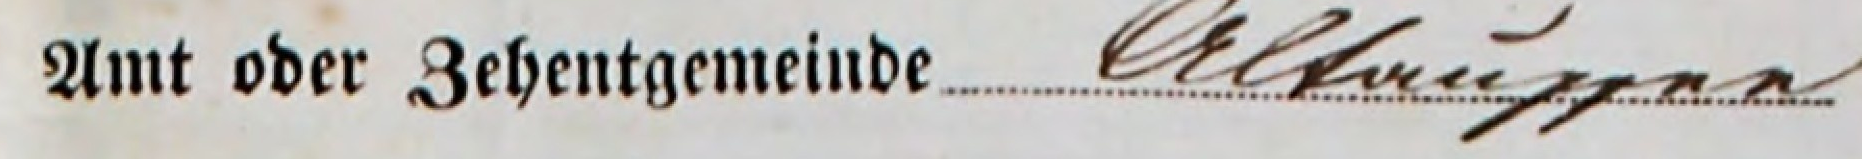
Amt oder Zehentgemeinde Aktaussee
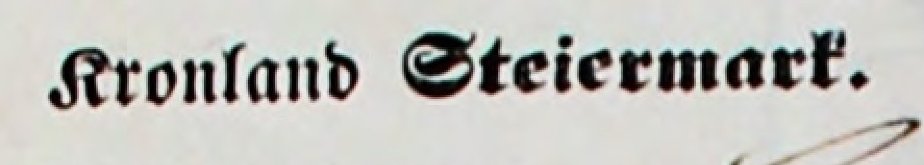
Kronland Steiermark.
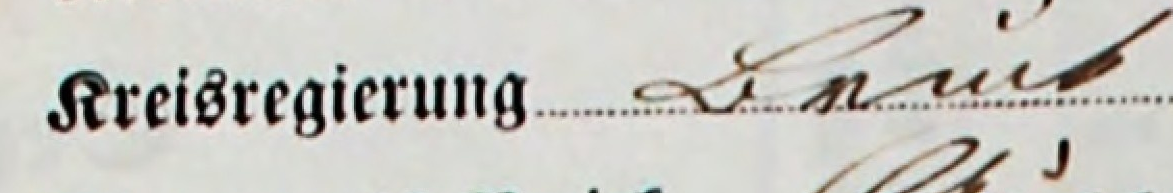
Kreisregierung Bruck
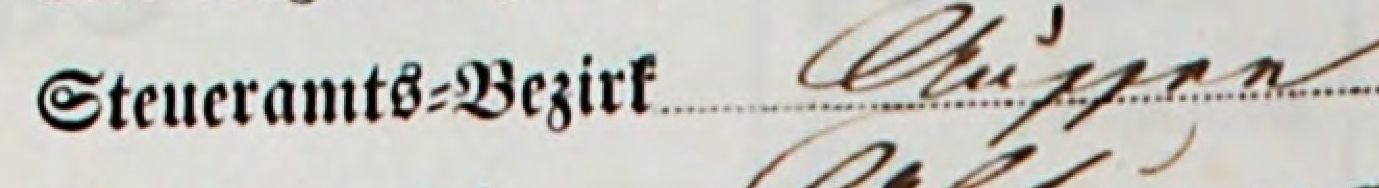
Steueramts=Bezirk Aussee
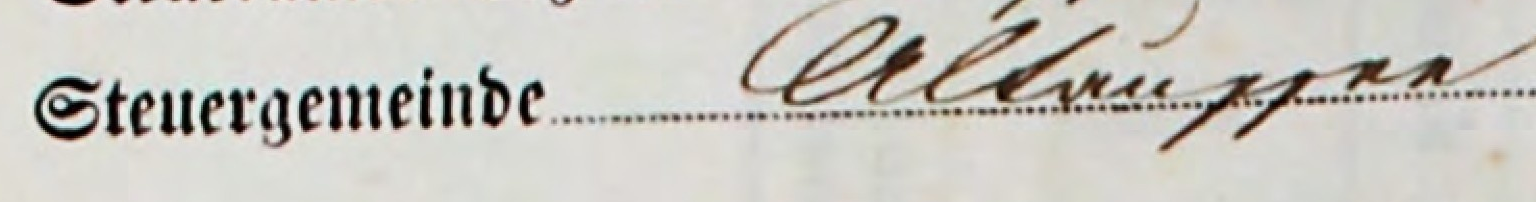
Steuergemeinde Altaussee
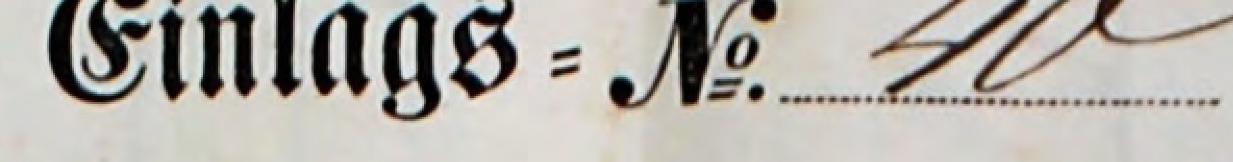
Einlags = No. 40
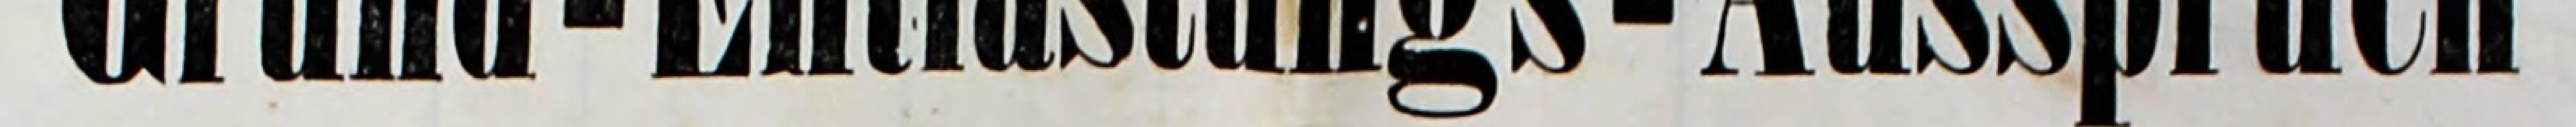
Grund - Entlastungs - Ausspruch
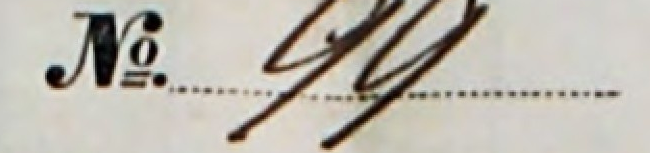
No. 99
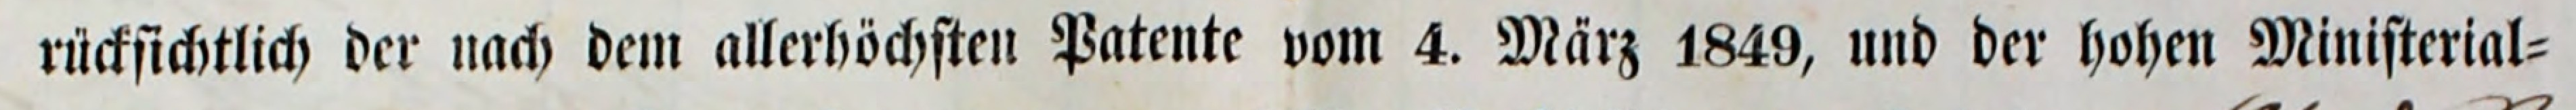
rücksichtlich der nach dem allerhöchsten Patente vom 4. März 1849, und der hohen Ministerial=
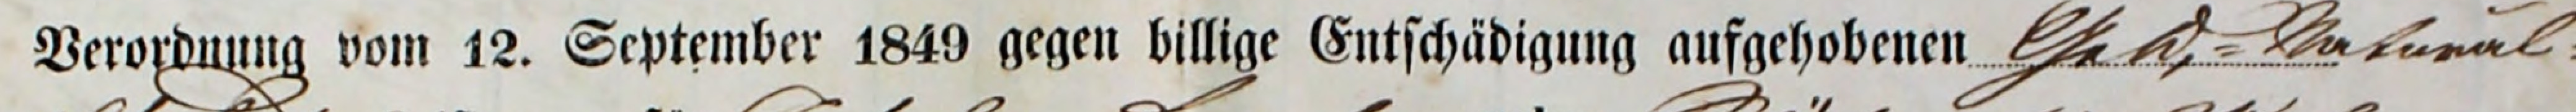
Verordnung vom 12. September 1849 gegen billige Entschädigung aufgehobenen Geld, = Natural=
